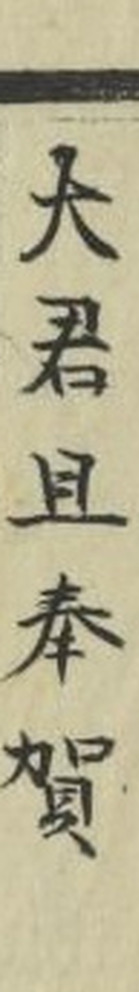大君且奉賀
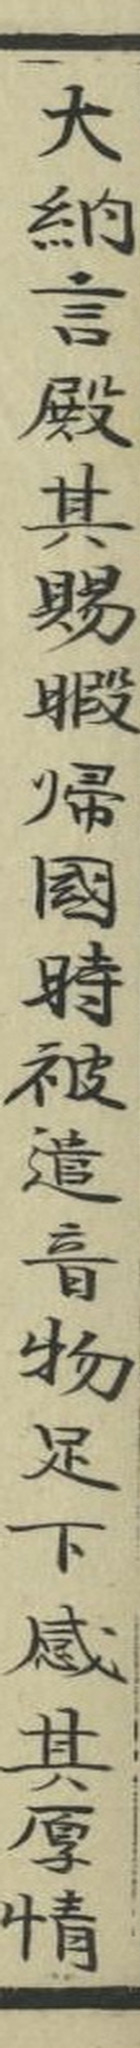大納言殿其賜暇帰国時被遣音物足下感其厚情
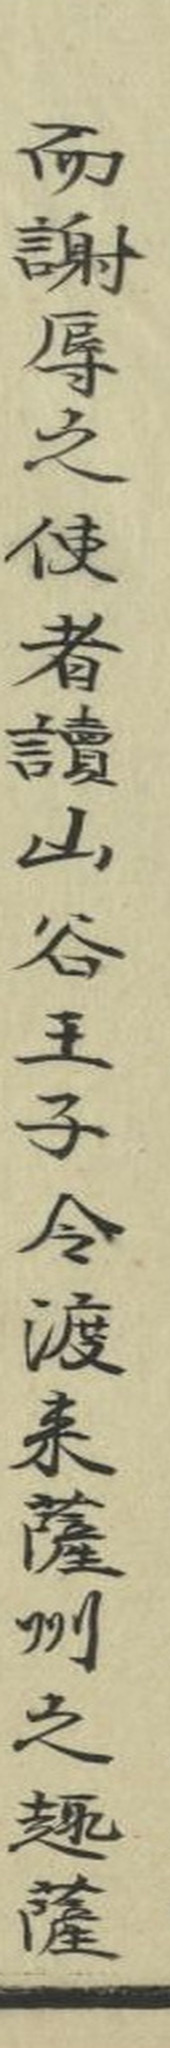而謝辱之使者読山谷王子令渡来薩州之趣薩
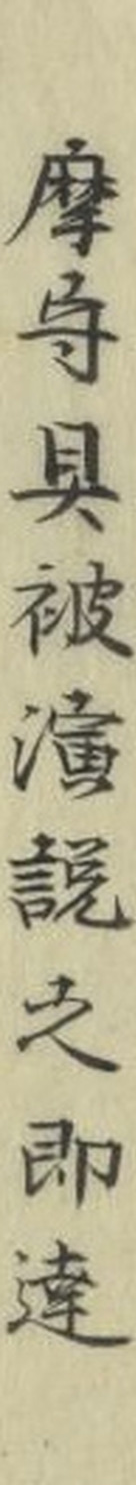摩守具被演説之即達
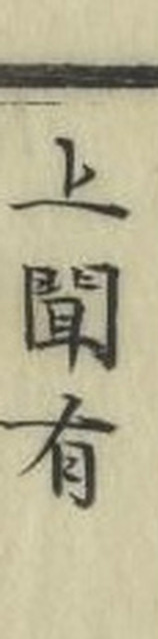上聞有
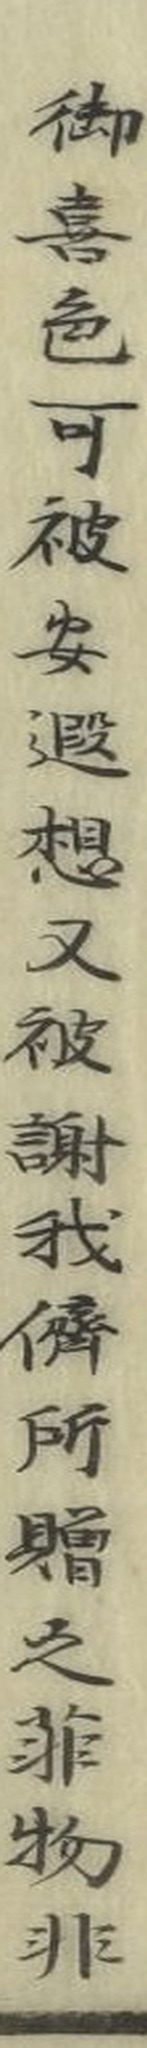御喜色可被安遐想又被謝我済所贈之菲物非
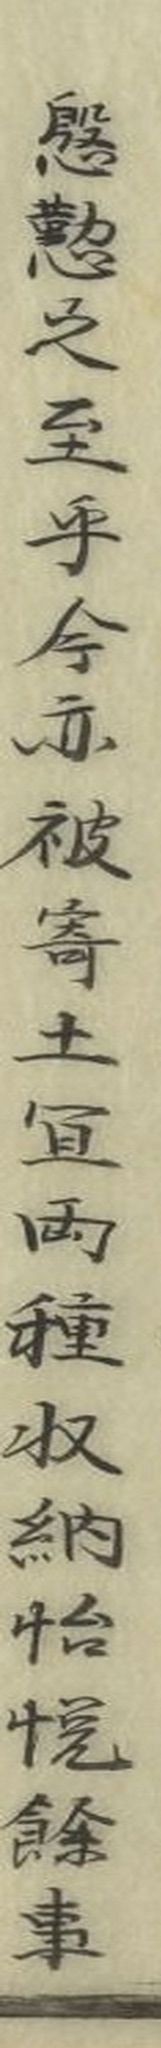慇懃之至乎今亦被寄土宜両種収納怡悦余事
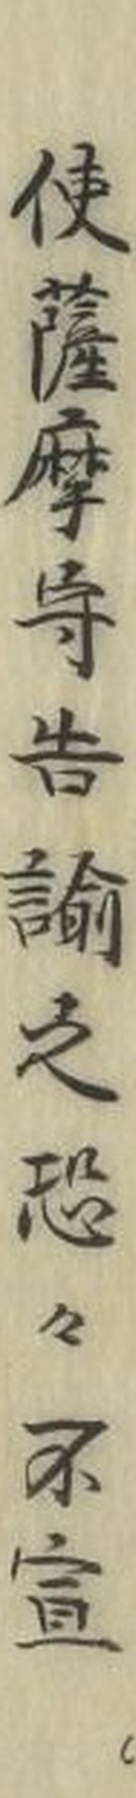使薩摩守告諭之恐々不宣
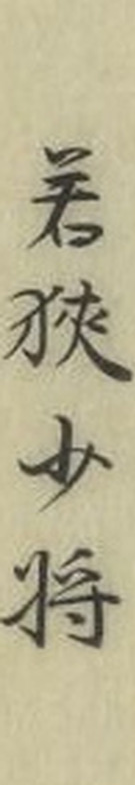若狭少将
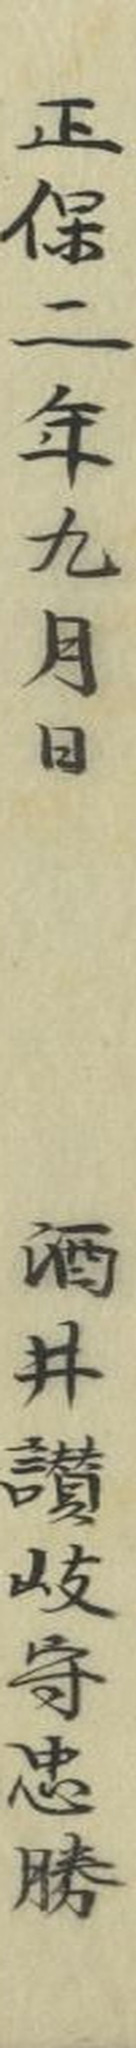正保二年九月日酒井讃岐守忠勝
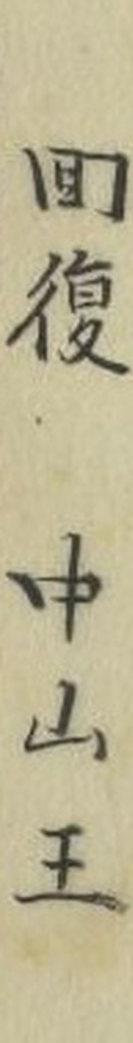回復中山王

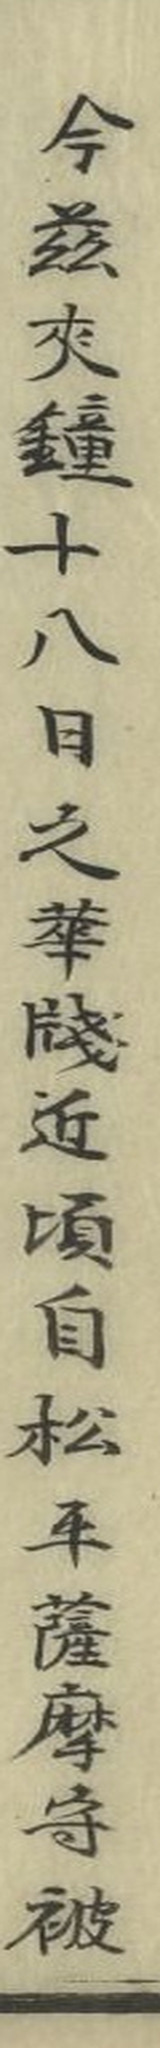今茲夾鐘十八日之華箋近頃自松平薩摩守被
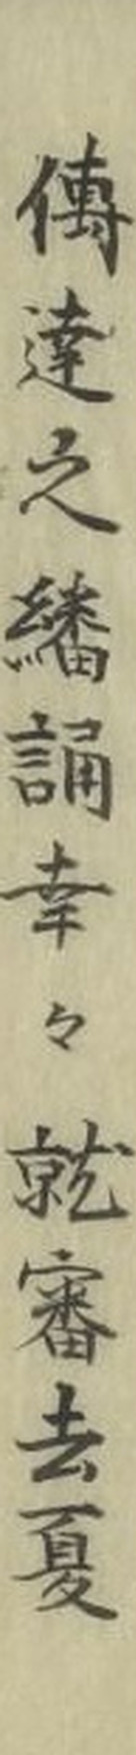伝達之繙誦幸々就審去夏
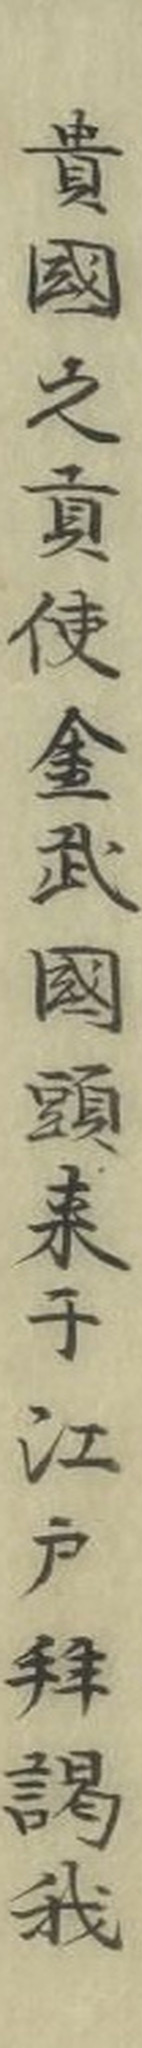貴国之貢使金武国頭来于江戸拝謁我
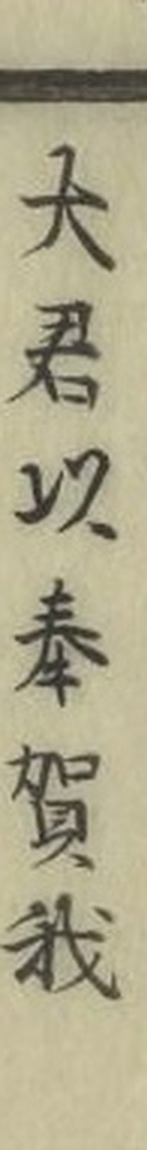大君以奉賀我
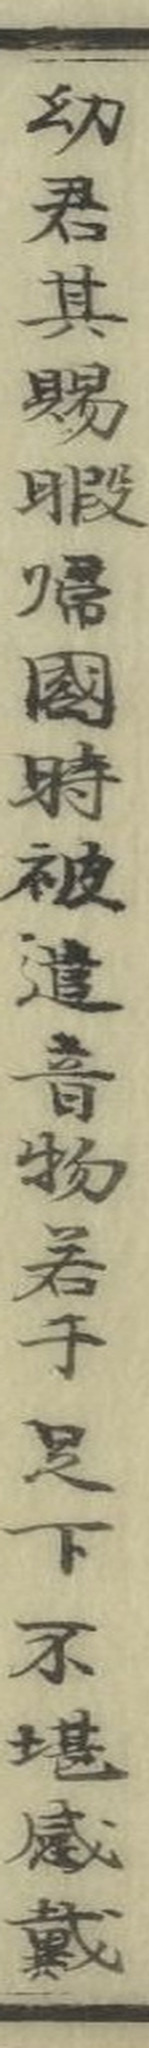幼君其賜暇帰国時被遣音物若干足下不堪感戴
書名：琉球往来（上）
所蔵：University of the Ryukyus Library
